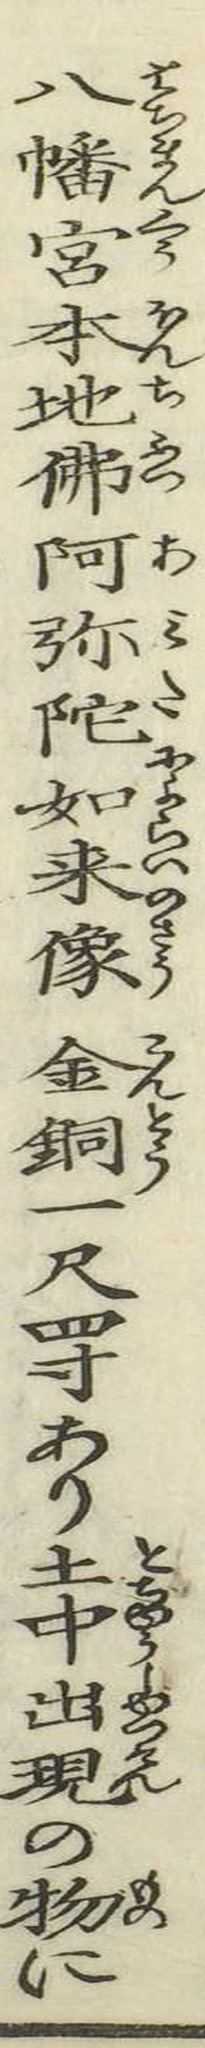八幡宮本地佛阿弥陀如来像金銅一尺四寸あり土中出現の物に
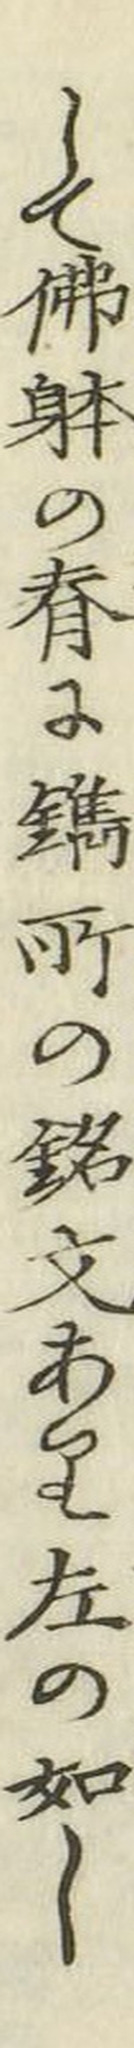して佛躰の脊に鐫所の銘文あり左の如し
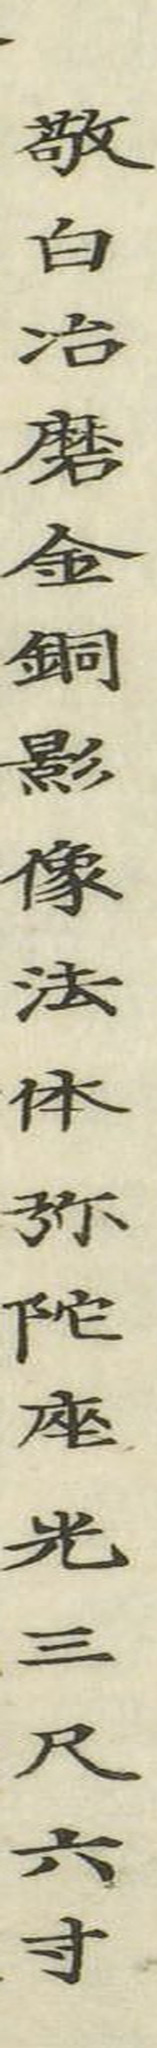敬白冶磨金銅影像法体弥陀座光三尺六寸
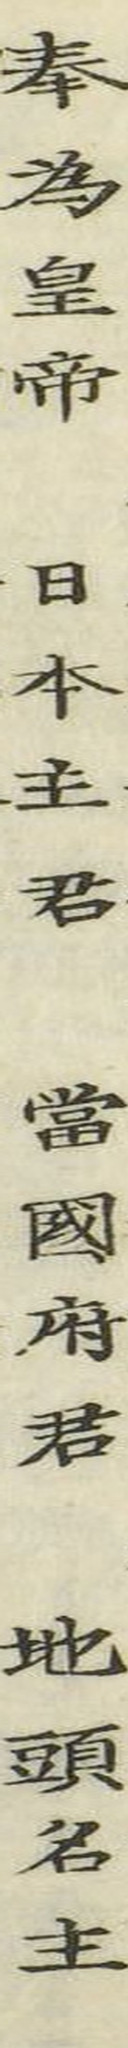奉為皇帝日本主君当国府君地頭名主
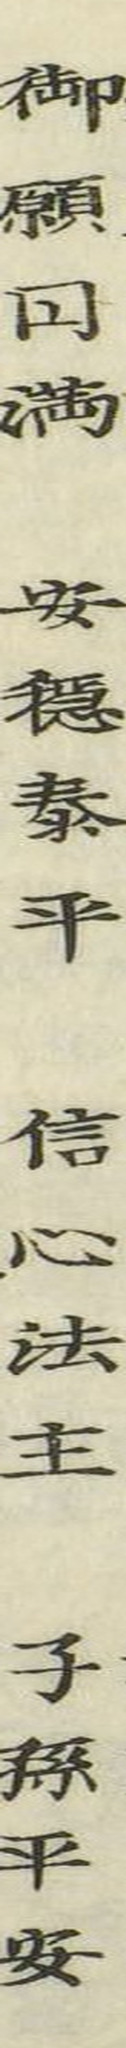御願円満安穏泰平信心法主子孫平安
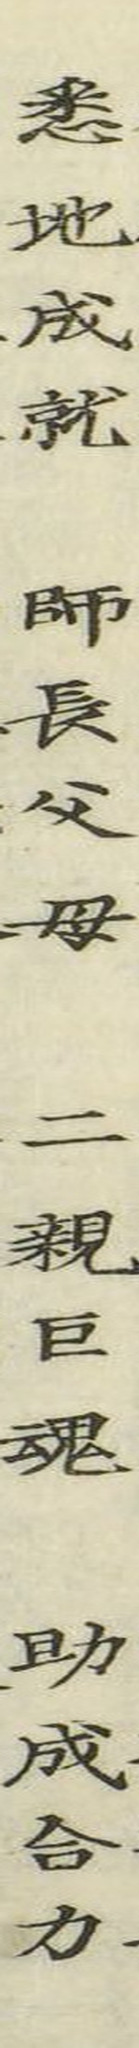悉地成就師長父母二親巨魂助成合力
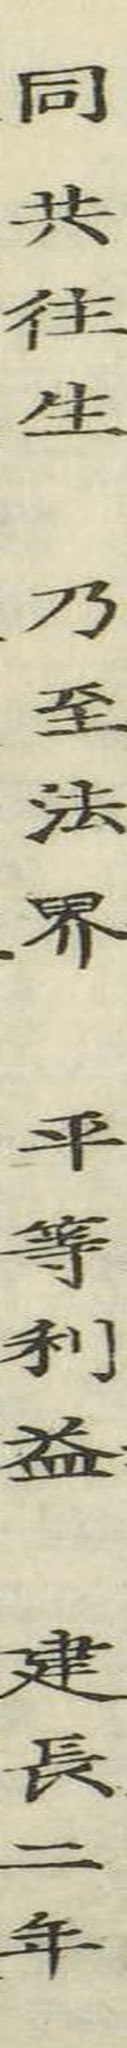同共往生乃至法界平等利益建長二年
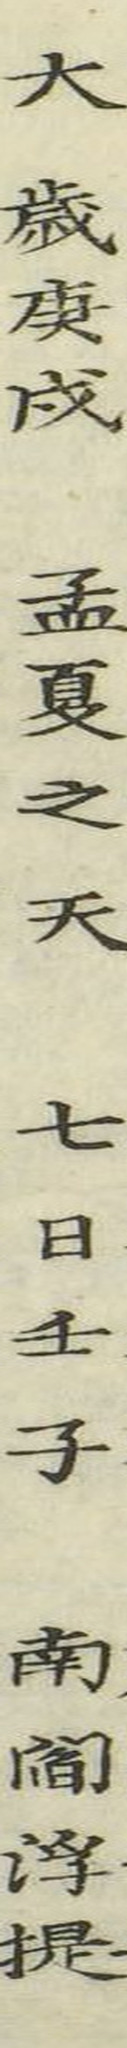大歳庚戌孟夏之天七日壬子南閻浮提
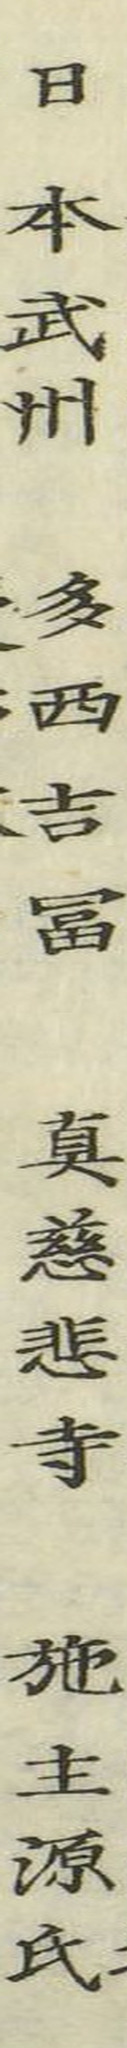日本武州多西吉冨真慈悲寺施主源氏
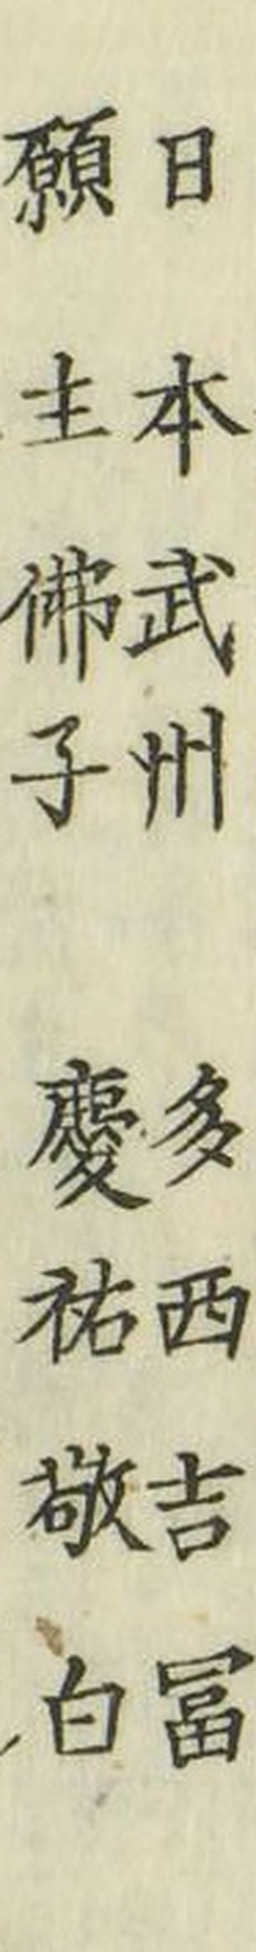願主佛子慶祐敬白

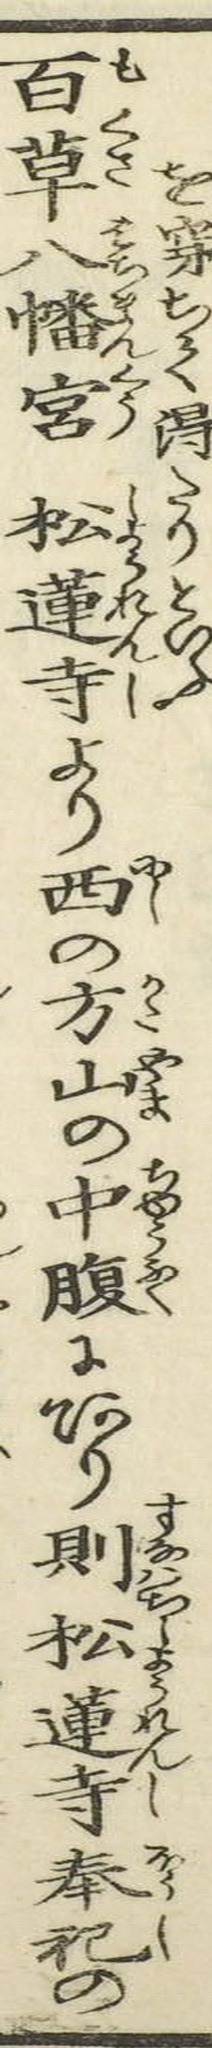百草八幡宮松蓮寺より西の方山の中腹にあり則松蓮寺奉祀の
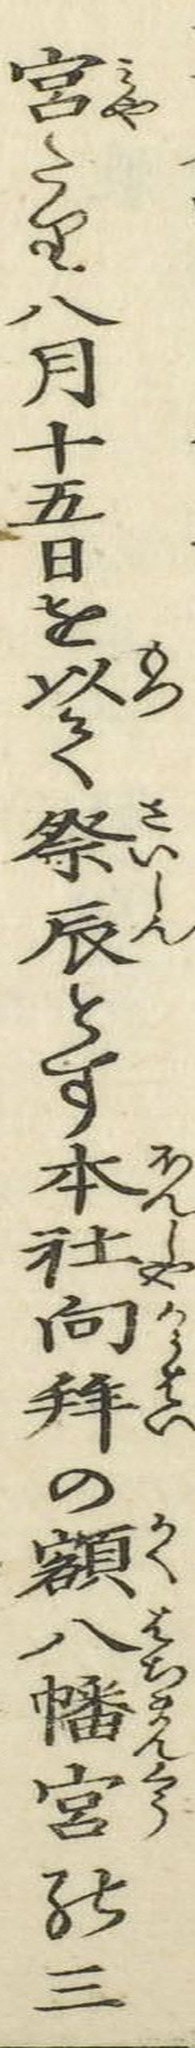宮たり八月十五日を以て祭辰とす本社向拝の額八幡宮の三
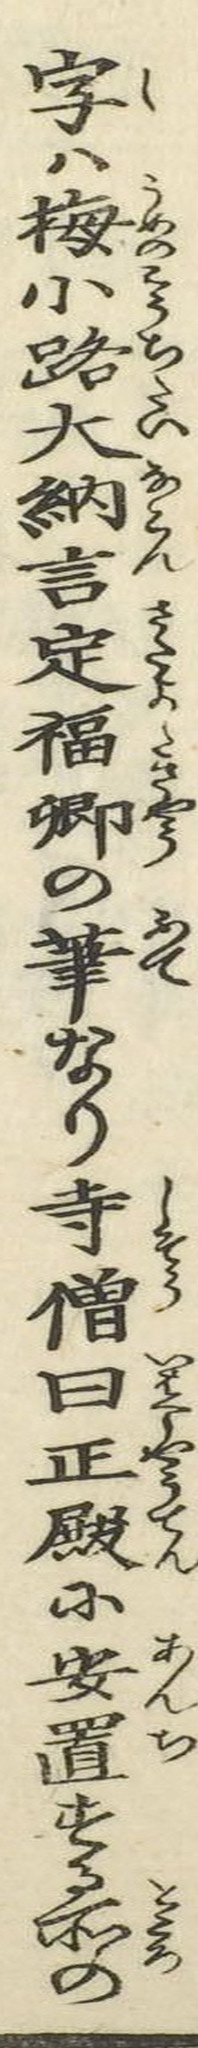字は梅小路大納言定福卿の筆なり寺僧曰正殿に安置する所の
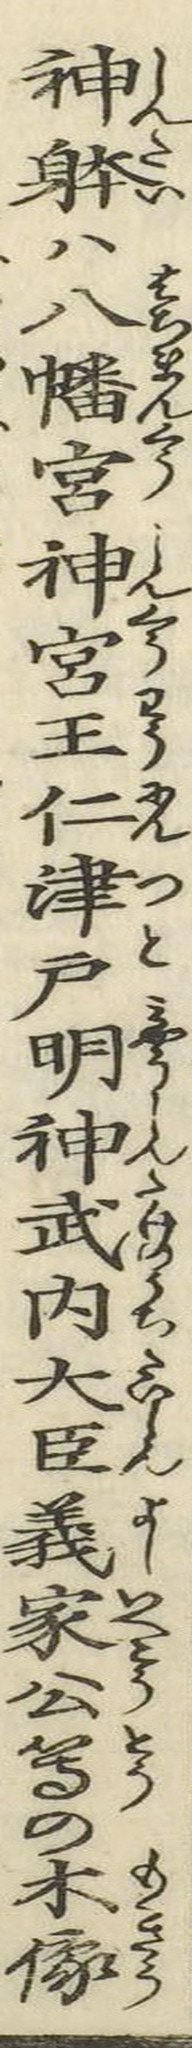神躰は八幡宮神宮王仁津戸明神武内大臣義家公等の木像
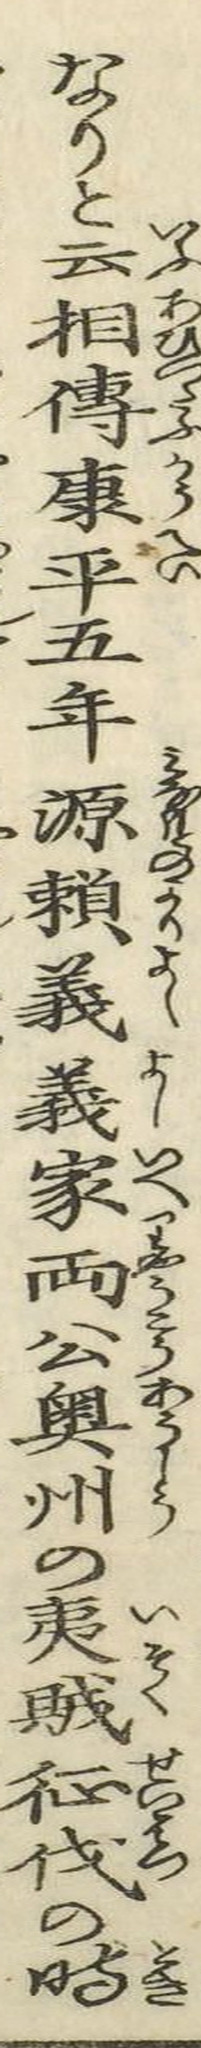なりと云相伝康平五年源頼義義家両公奥州の夷賊征伐の時
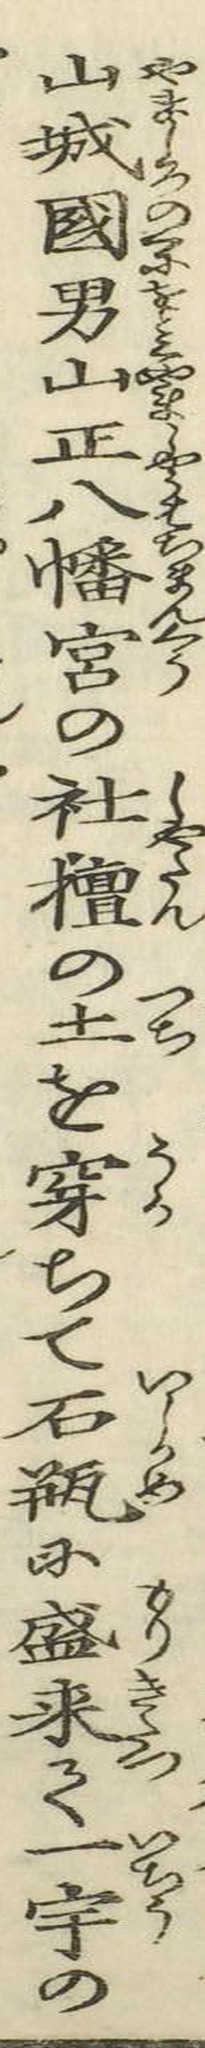山城国男山正八幡宮の社檀の土を穿ちて石瓶に盛来て一宇の
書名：江戸名所図会 20巻 巻之10
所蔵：東京学芸大学教育コンテンツアーカイブ
